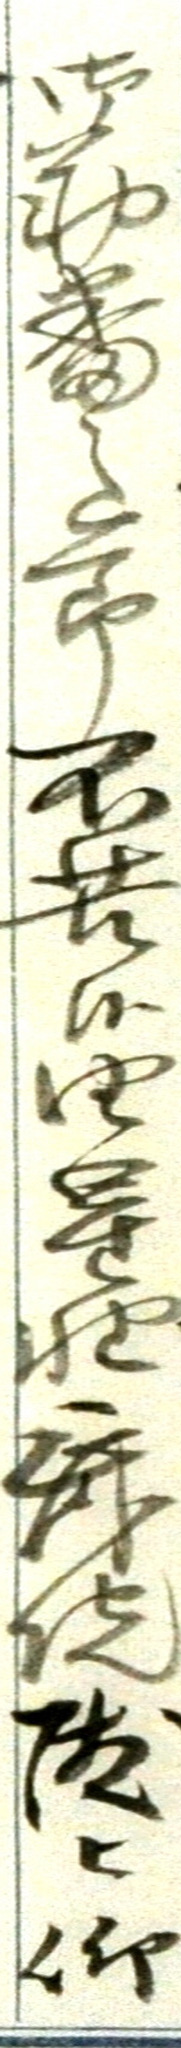御勤番之節不苦候由星野斎院殿被仰
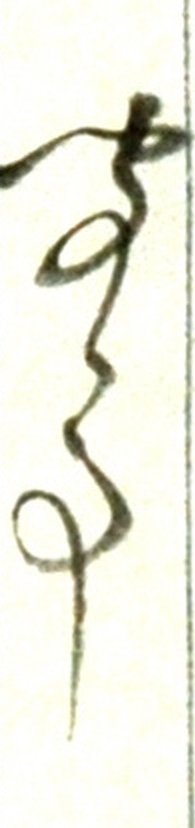聞候事
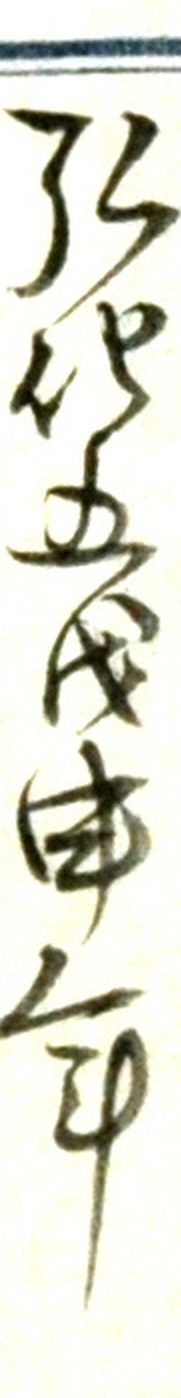弘化五戊申年

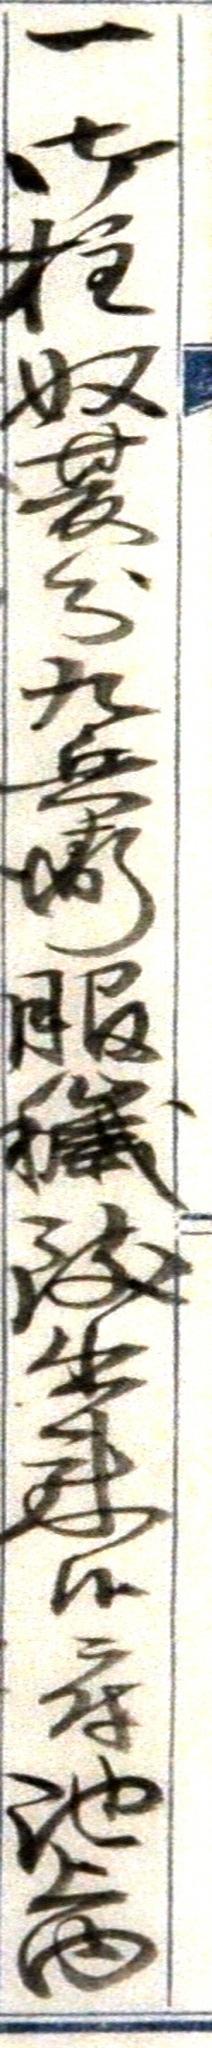一御柱奴夏分九兵衛服穢致出来候ニ付池上内
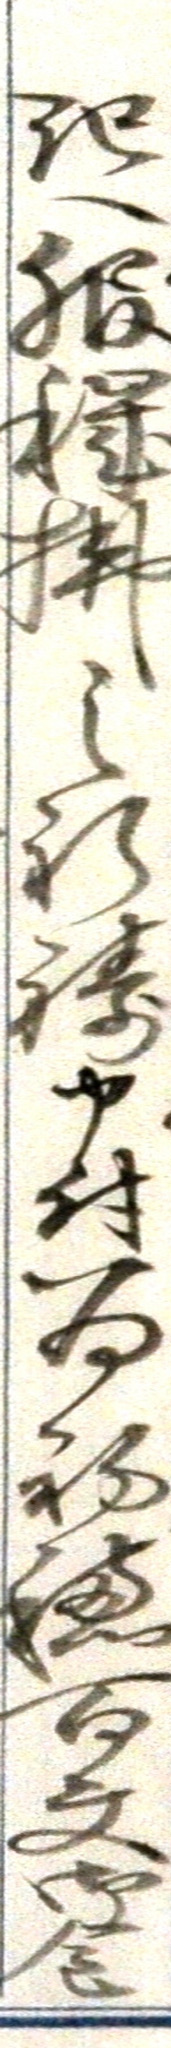記へ服穢払之祈祷申付為初穂百文御金
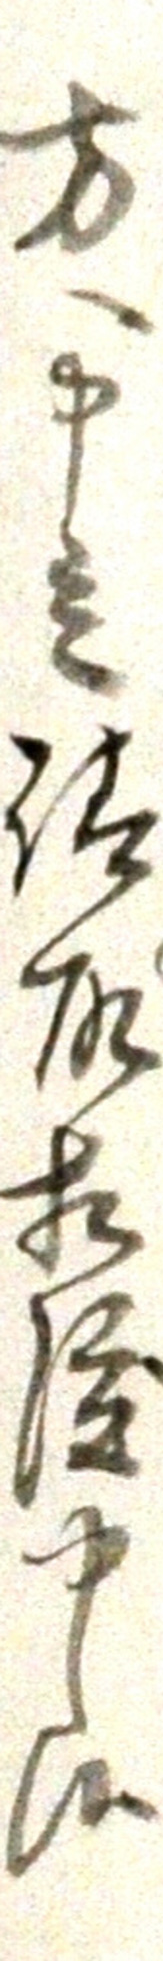方へ申立請取相渡申候
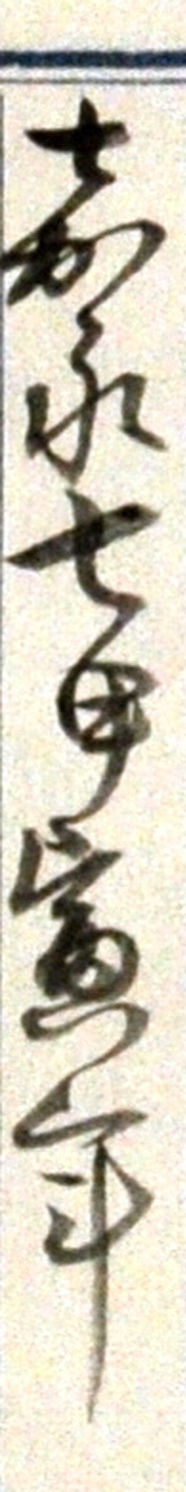嘉永七甲寅年
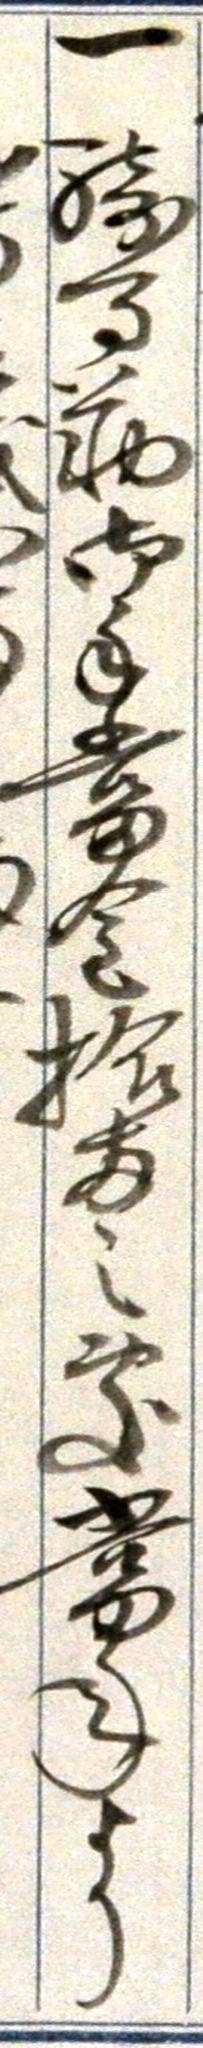一騎馬勤御手当金拾両之処当年より
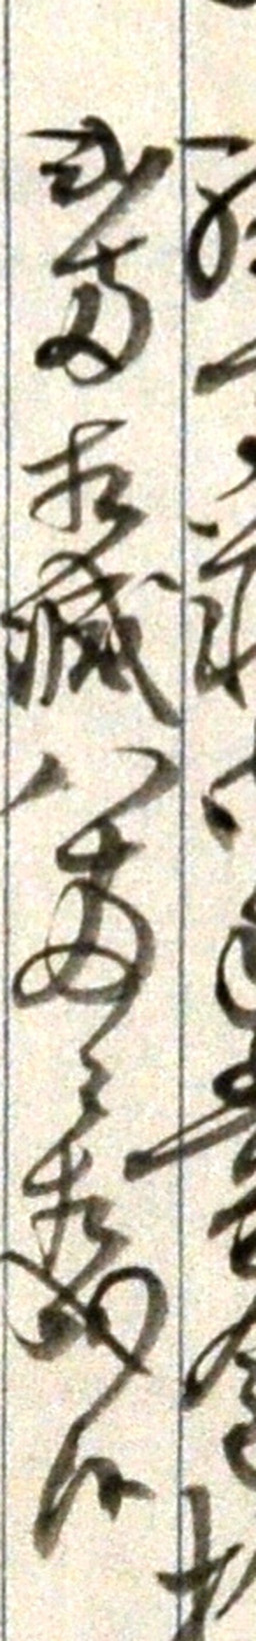弐両相減八両ニ相成候
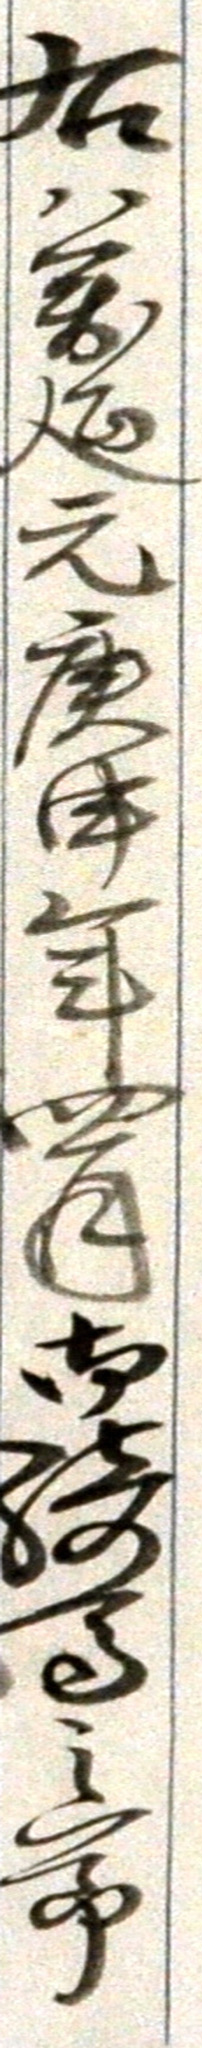右ハ万延元庚申年四月御騎馬之節
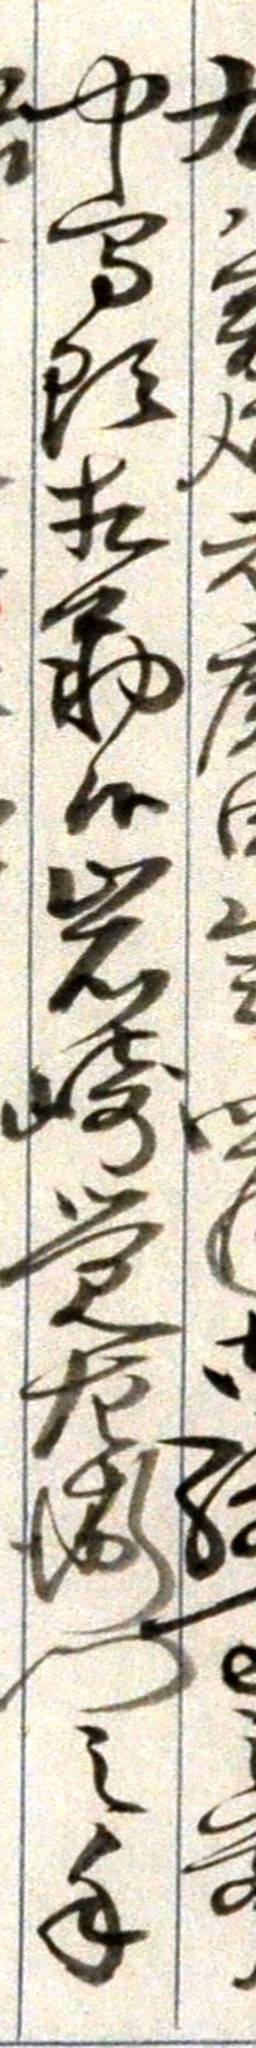中間頭相勤候岩崎覚左衛門之手
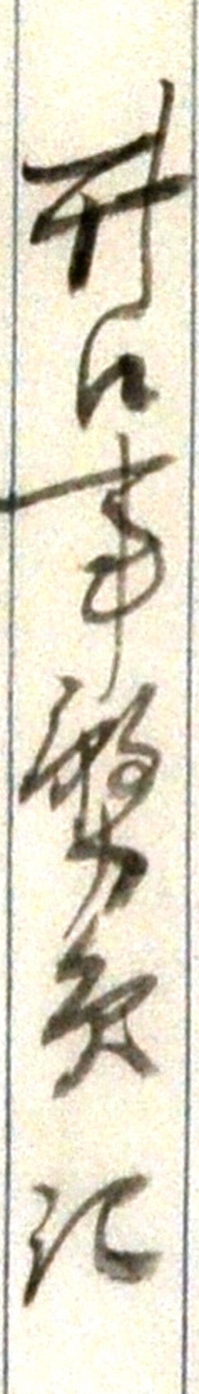井口事務員記
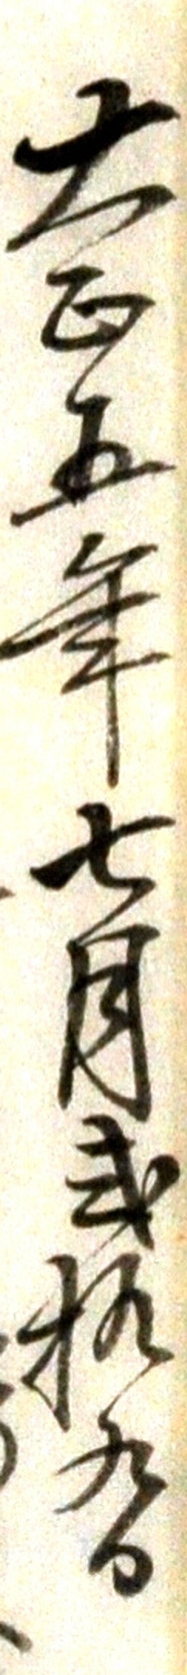大正五年七月弐拾九日
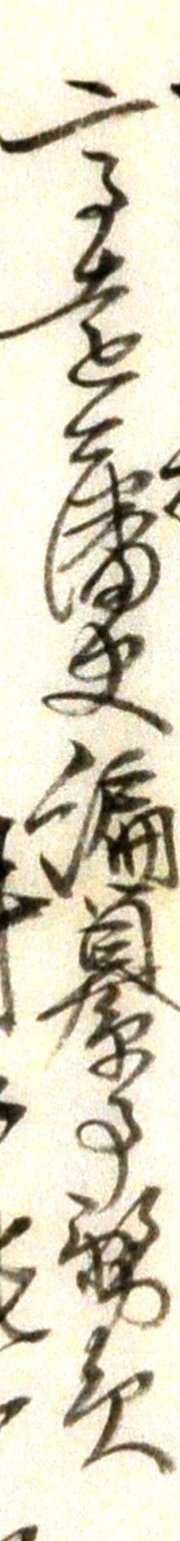高遠藩史編纂事務負
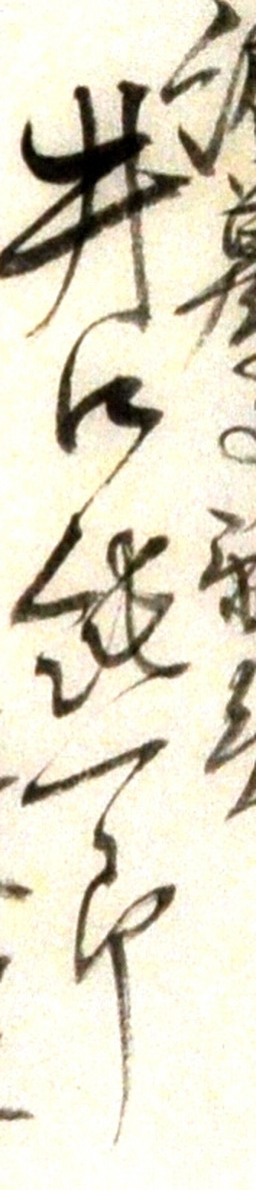井口純一郎

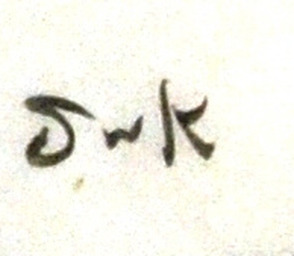同同同同
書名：諏訪御柱祭之節・騎馬大将御中間頭・御柱引人足
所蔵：伊那市立高遠町図書館・合同会社AMANE
